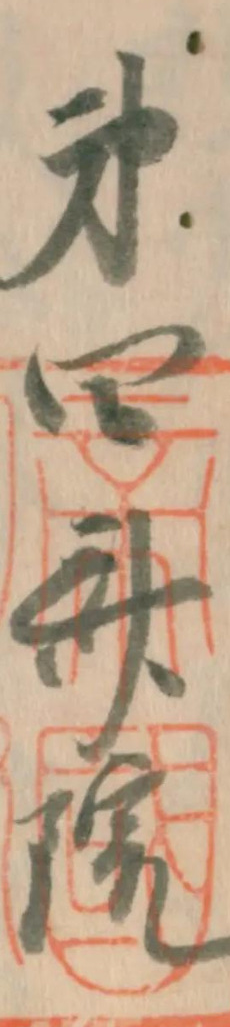㐧四斎院
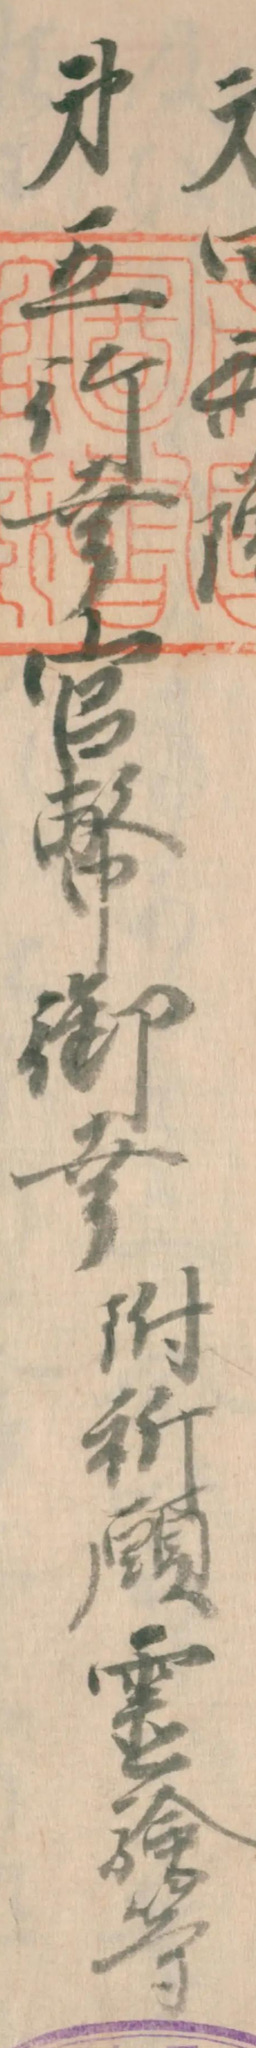㐧五行幸官幣御幸附祈願霊験等
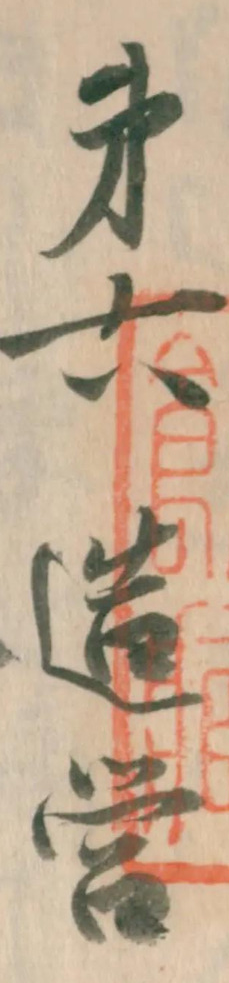㐧六造営
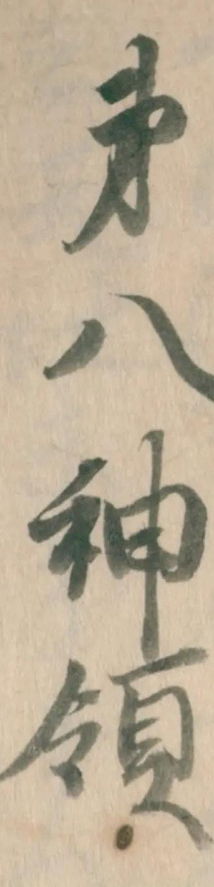㐧八神領

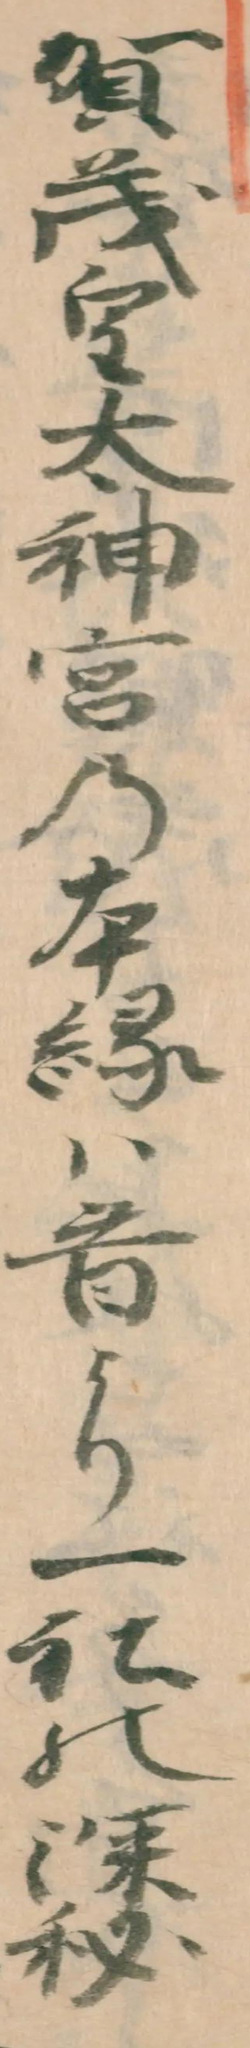賀茂皇太神宮の本縁は昔より一社の深秘にて
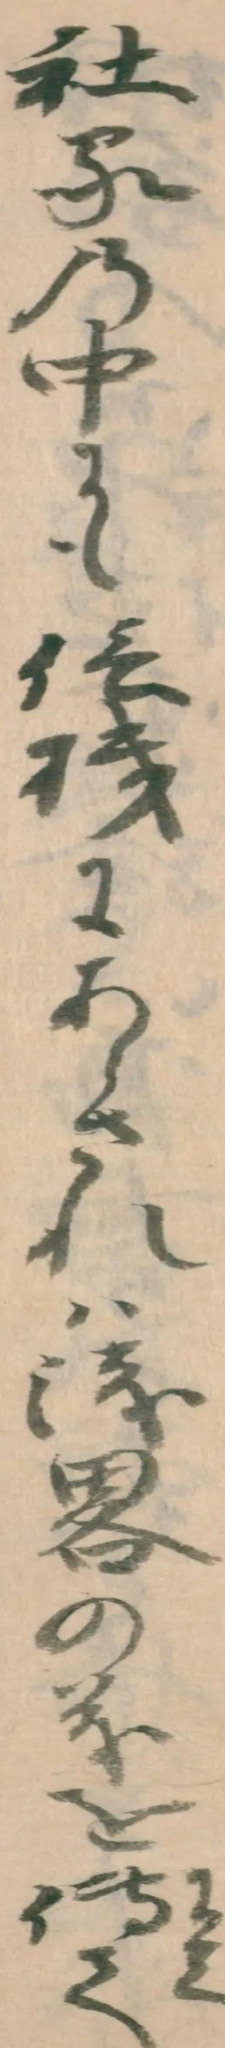社家の中にも信機にあらされは浅略の義を伝て
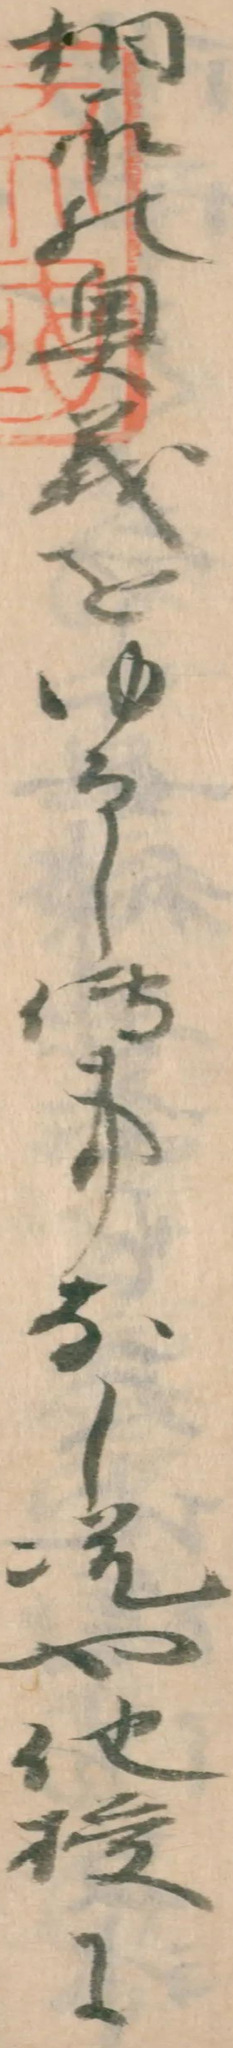相承の奥義をゆるし伝事なし况や他授に
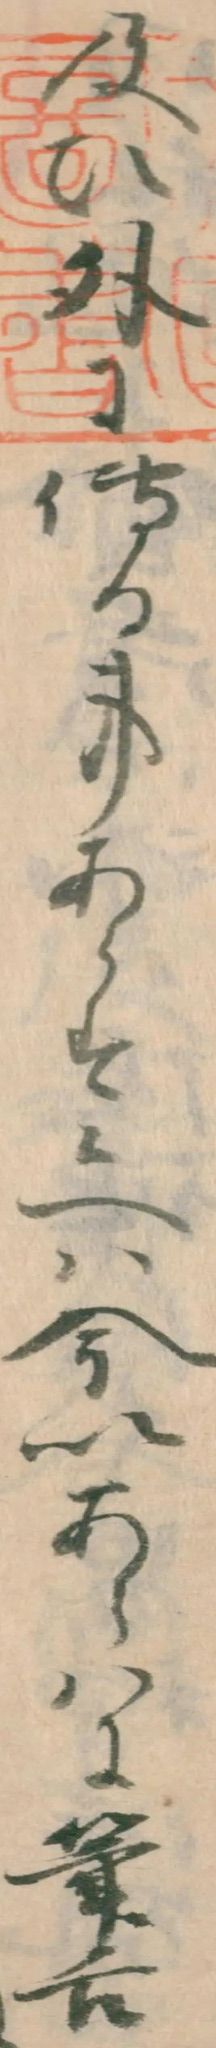及ひ外に伝る事あらす候へは今以あらはに筆舌に
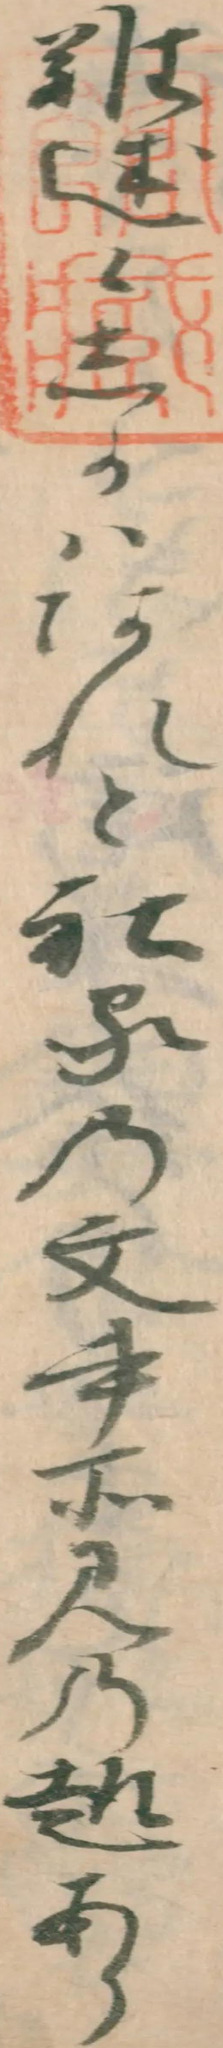難述候しかはあれと社家の文書所見の趣あら
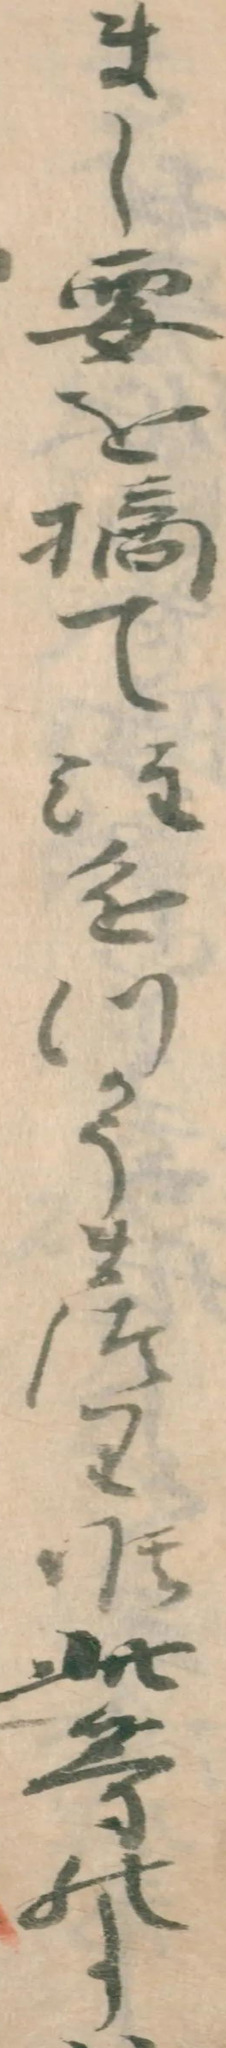まし要を摘て注進つかうまつり候此等の事は
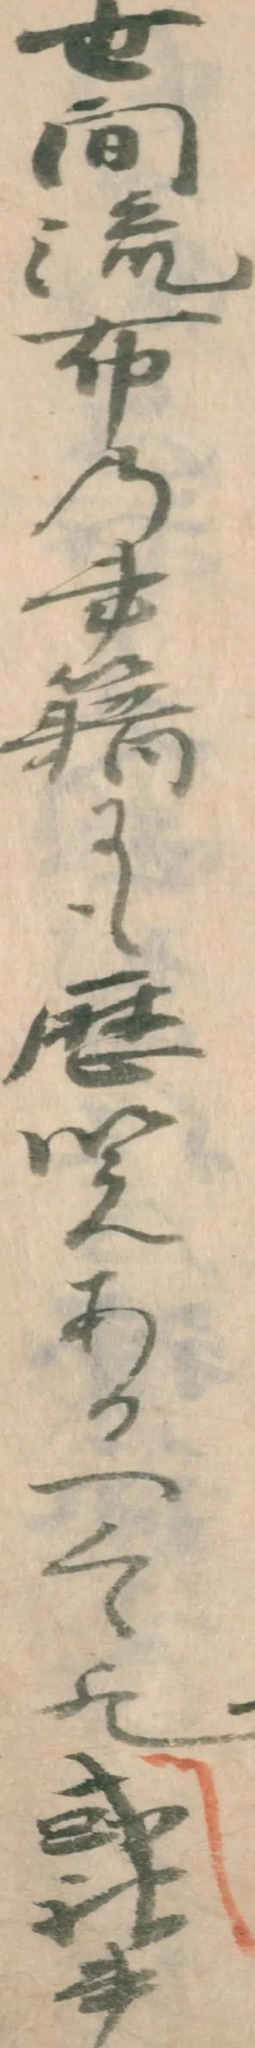世間流布の書籍にも歴覧あるへく候歟或神書
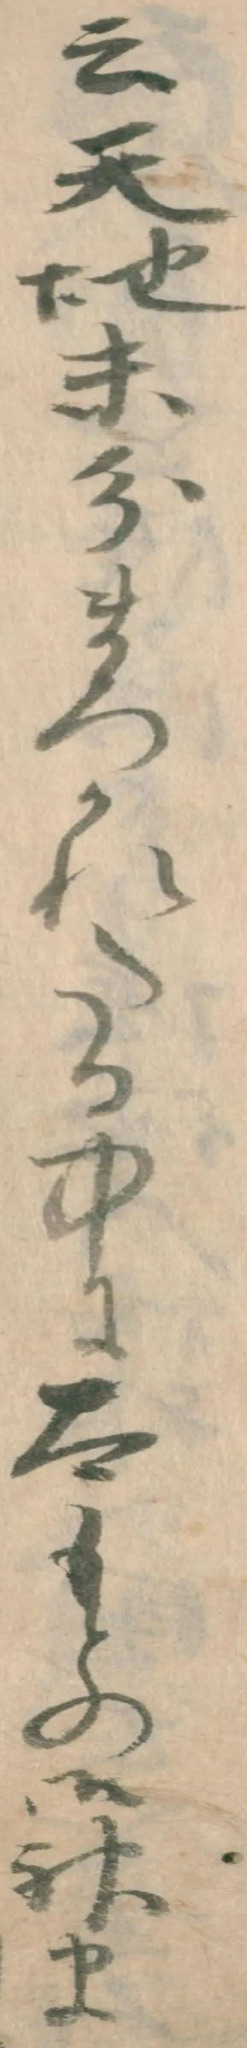云天地未分まろかれたる中に太もとの御神まし
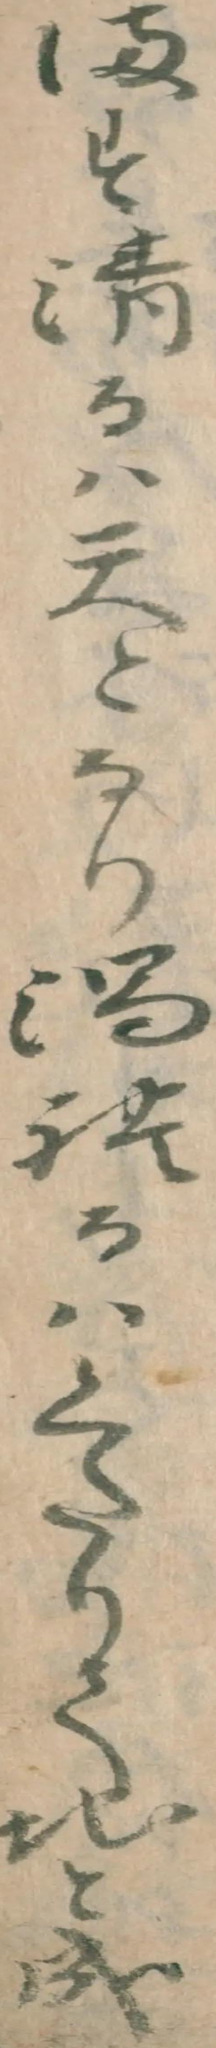ます清るは天となり濁れるはくたりて地と成し

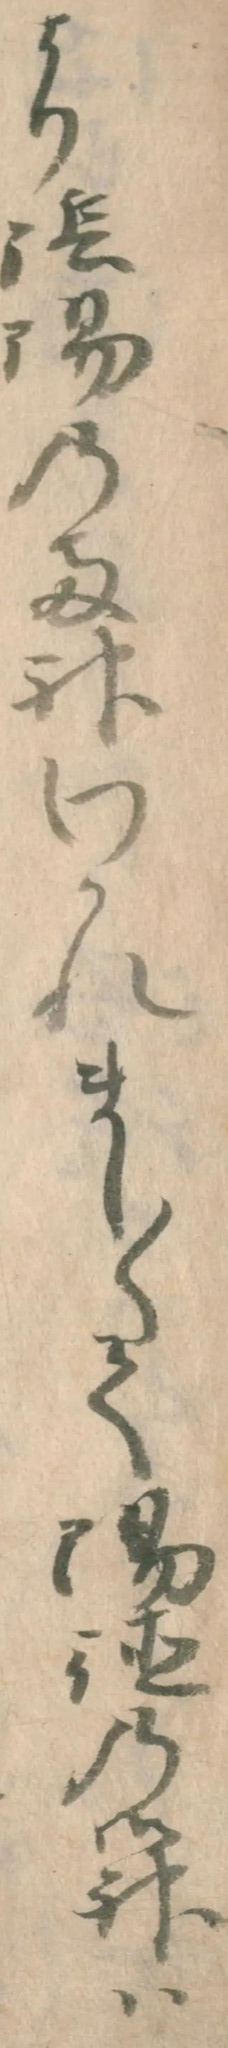より陰陽の両神わかれまし〳〵て陽徳の御神は
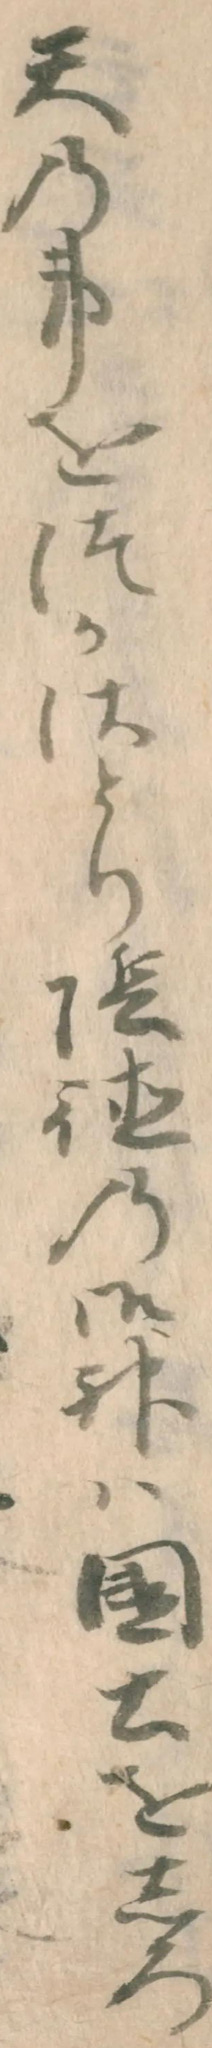天の事をつかさとり陰徳の御神は国土をしろ
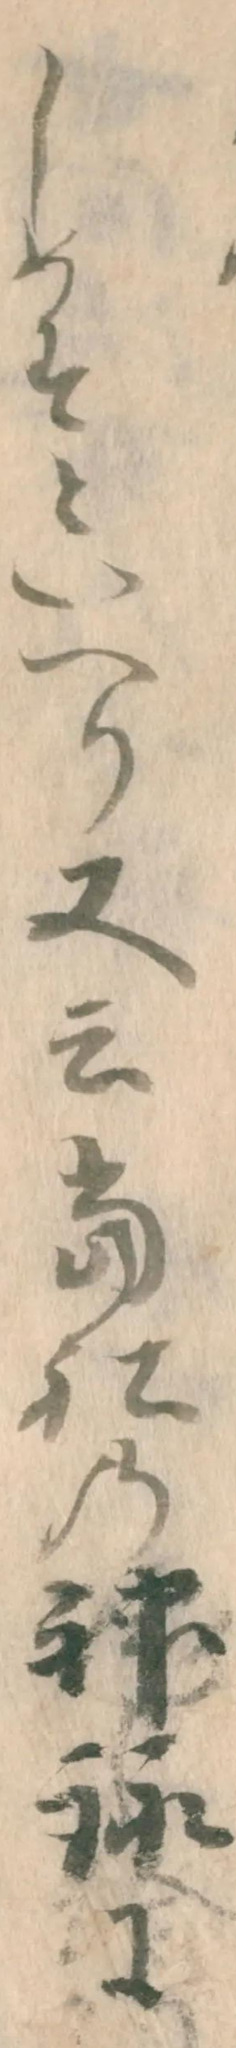しめすといへり又云当社の神詠に
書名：賀茂社記録. 第1冊
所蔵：国立国会図書館 National Diet Library, JAPAN
